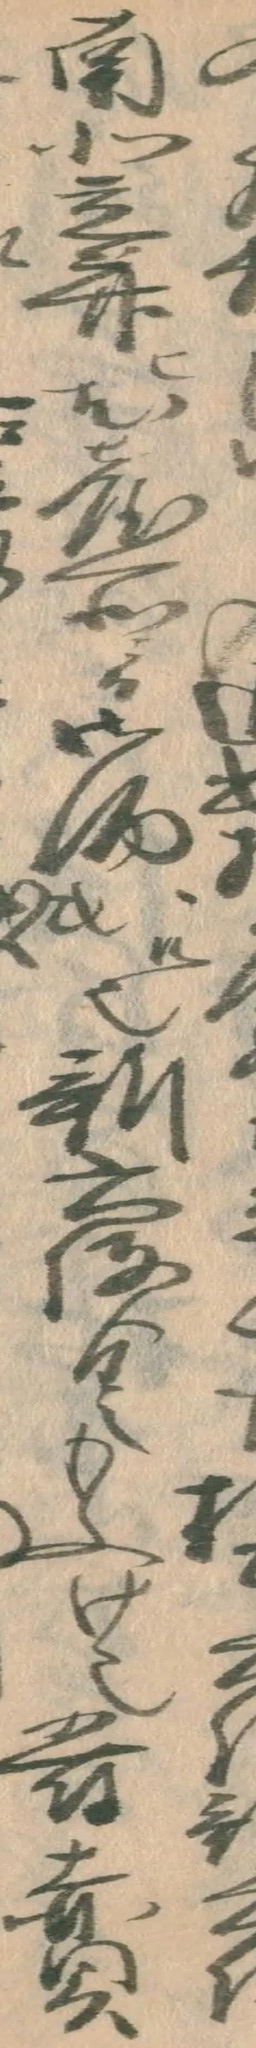南北立并ヒ尤産所ニ而御酒出ル也新六役ゟ之もふけ也肴赤貝
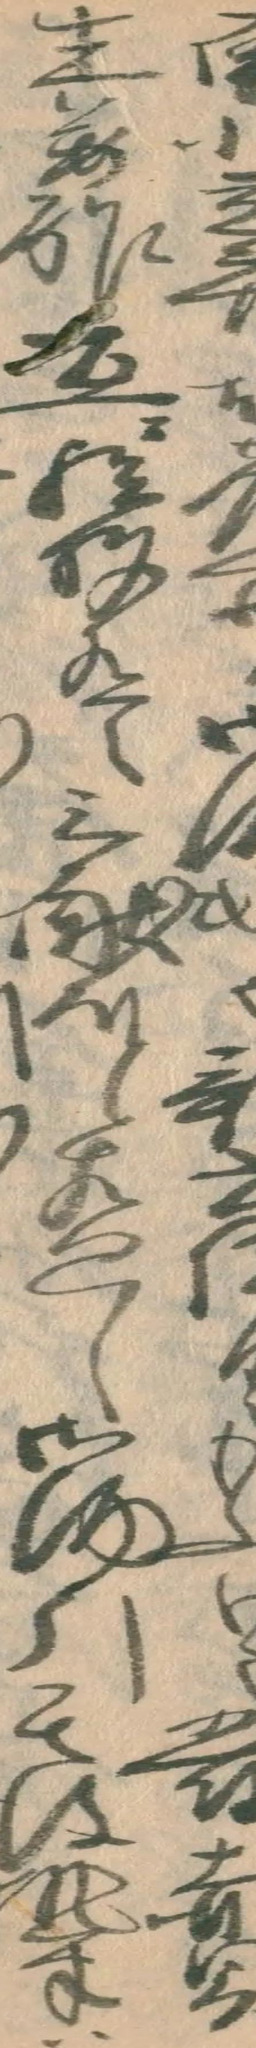生姜酢互ニ挨拶有之三献なと相廻し御酒引其後執筆ハ
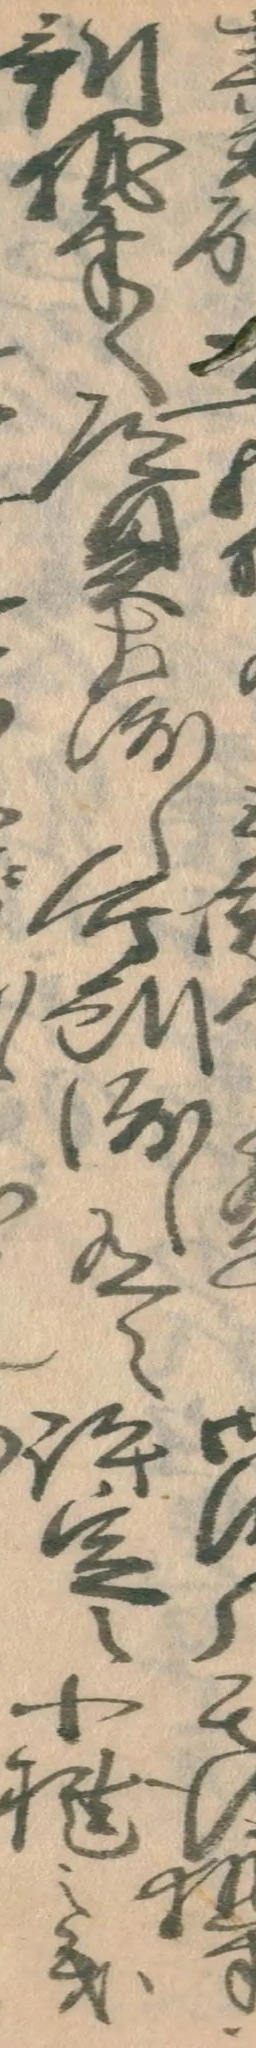新執筆へ道具相渡し会所渡し有之評定之小櫃之義
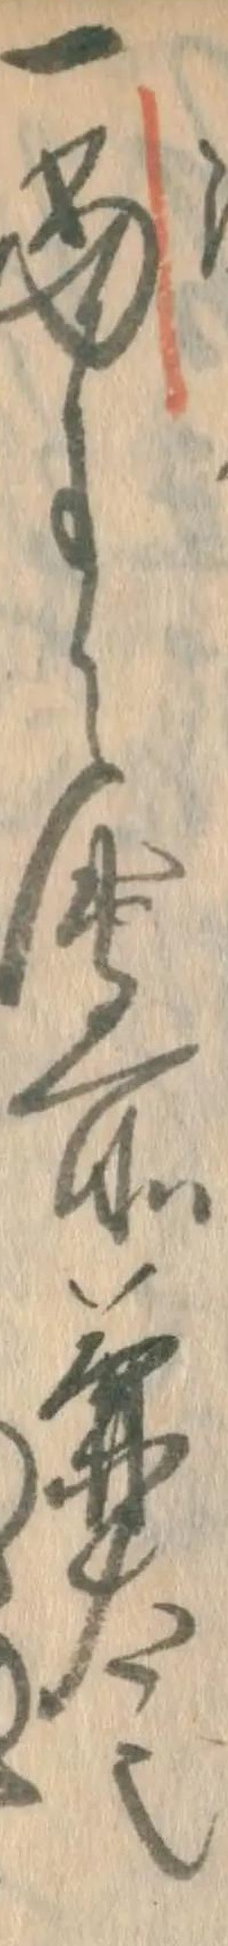一当事之会所兼太也
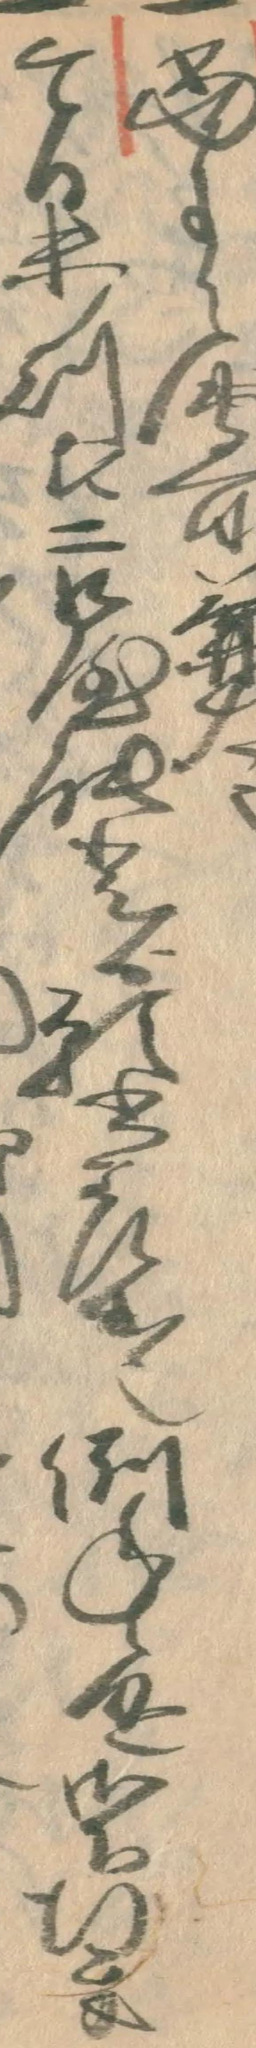一今日未ノ刻比二口屋能登ゟ願書差出也例年之通御下行米
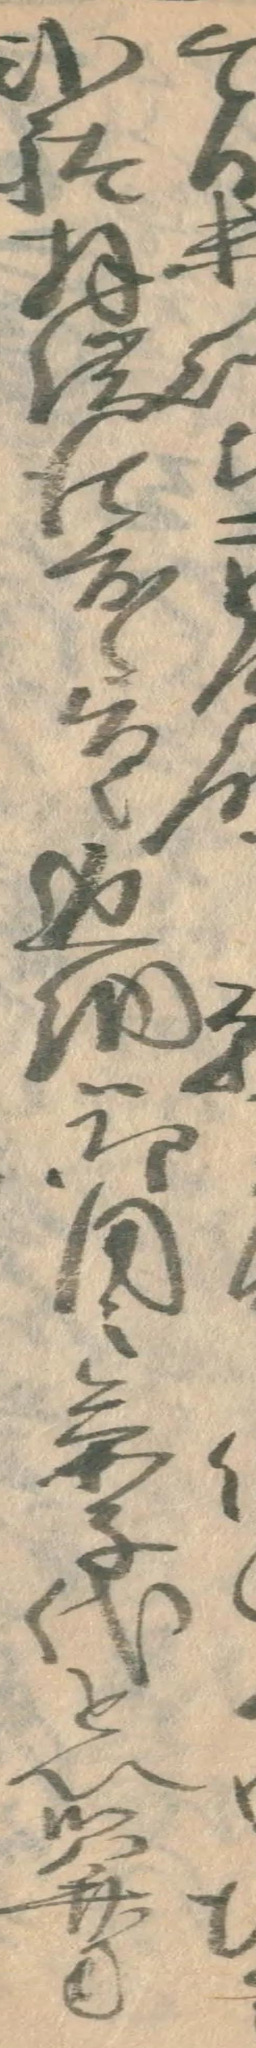弐駄拝借仕度之旨也追納ハ御用之子代を以算用
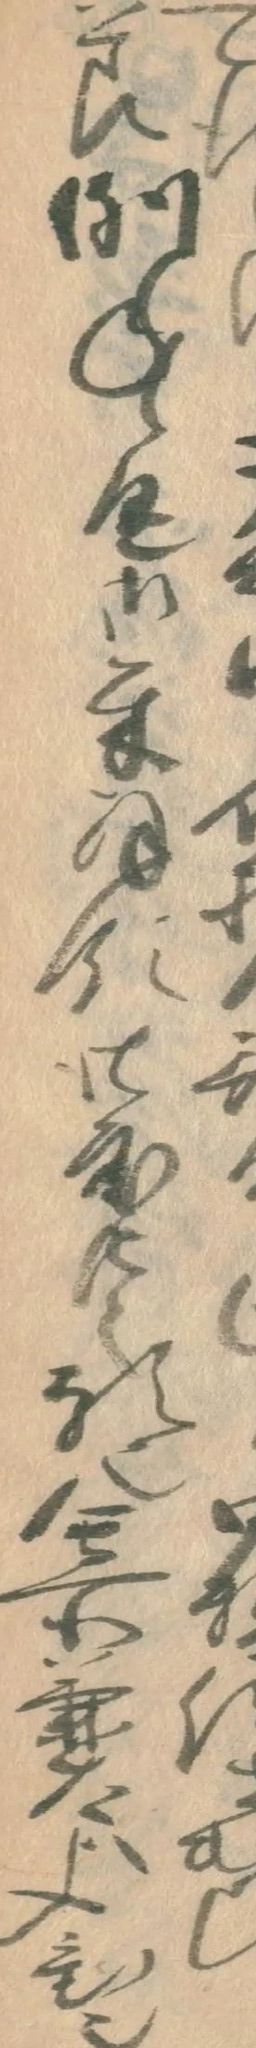節例年之通御米拝領仕度由之願也会所兼太へ申入置也

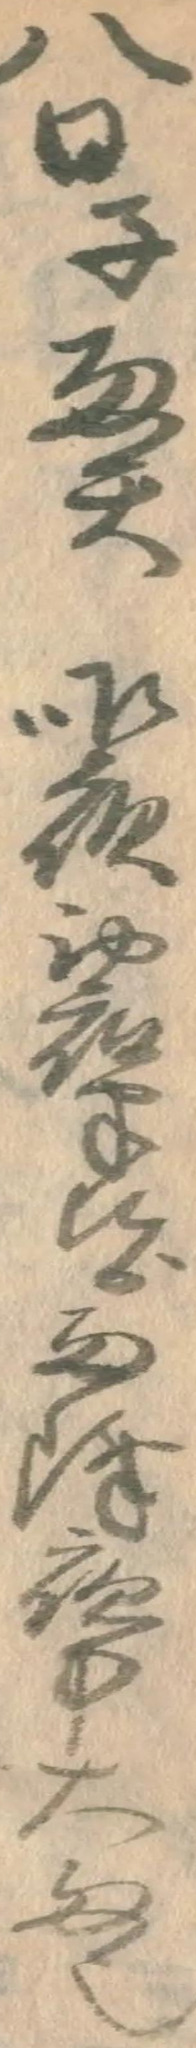八日子雨天昨夜初夜半比ゟ雨降夜中大雨也
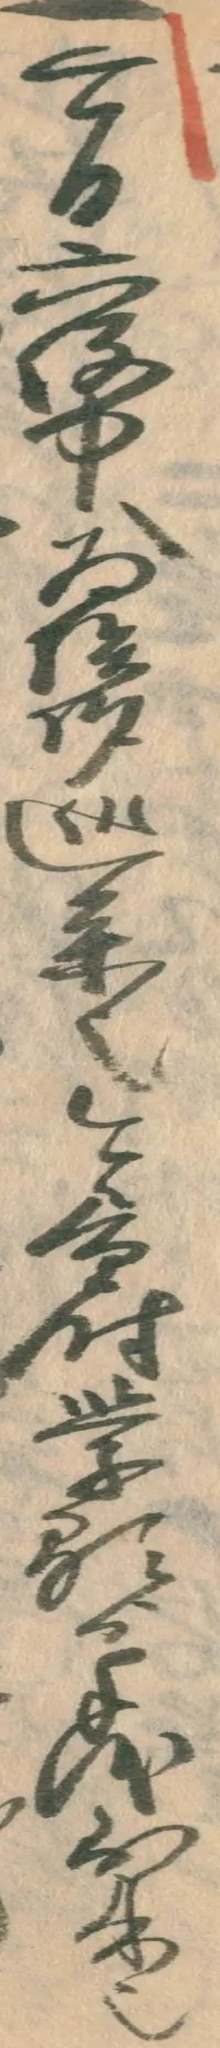一今日六役中へ為挨拶巡参也今昼時学顕ゟ手紙到来也
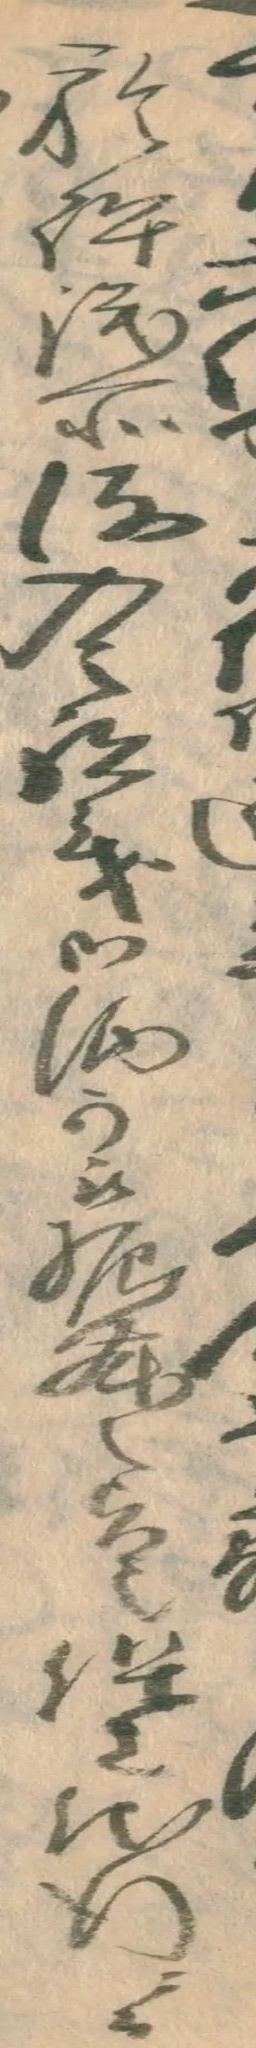於評議所役入之祝義御酒可被振舞之旨也保土他行ニ而
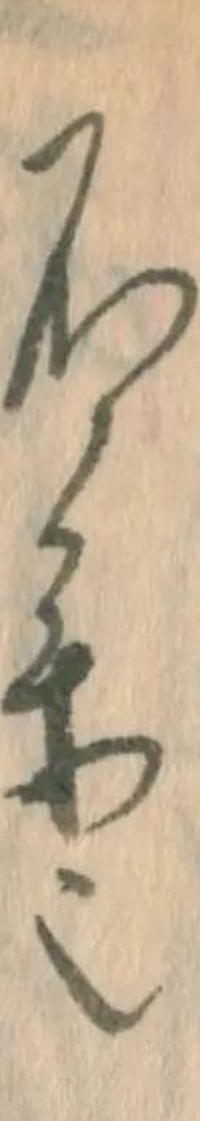不参也
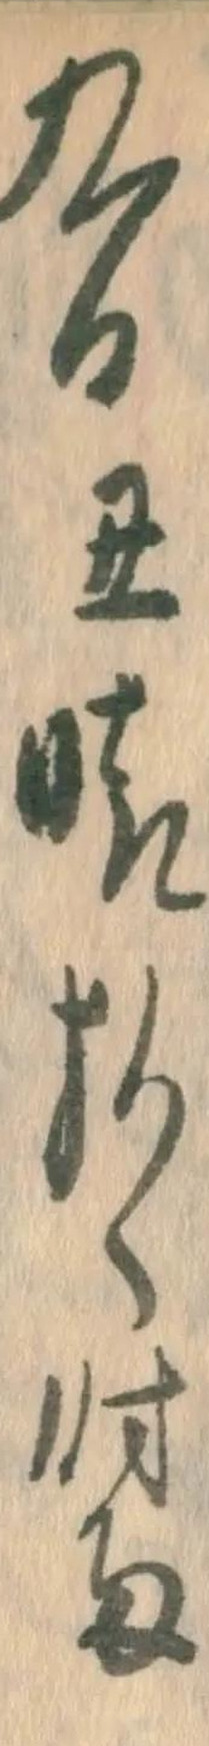九日丑晴折々時雨
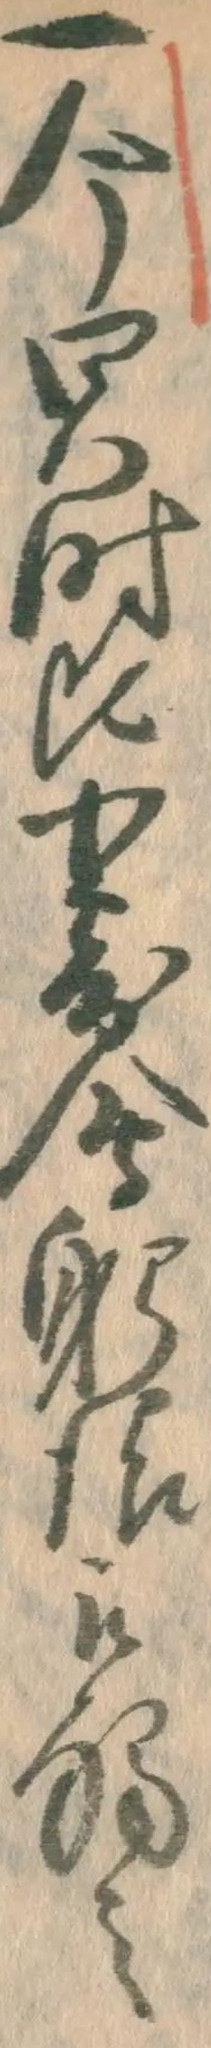一今四ツ時比小寄会躬清被触之
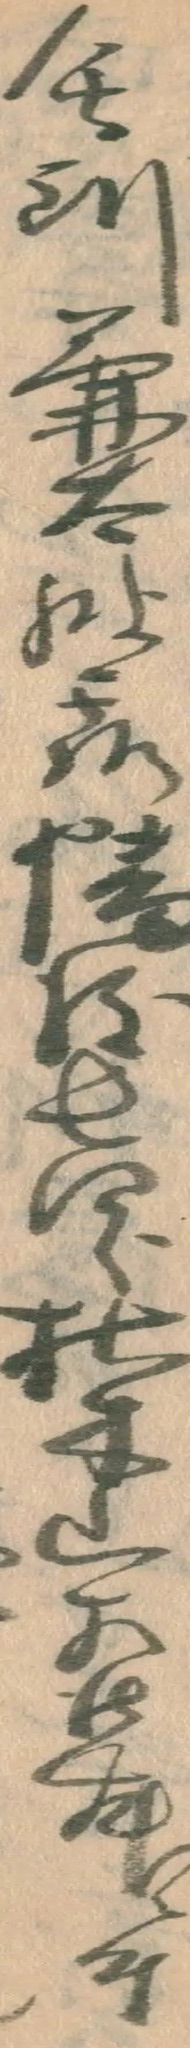会所兼太披露幡枝長四郎枯木山相仕舞ニ付
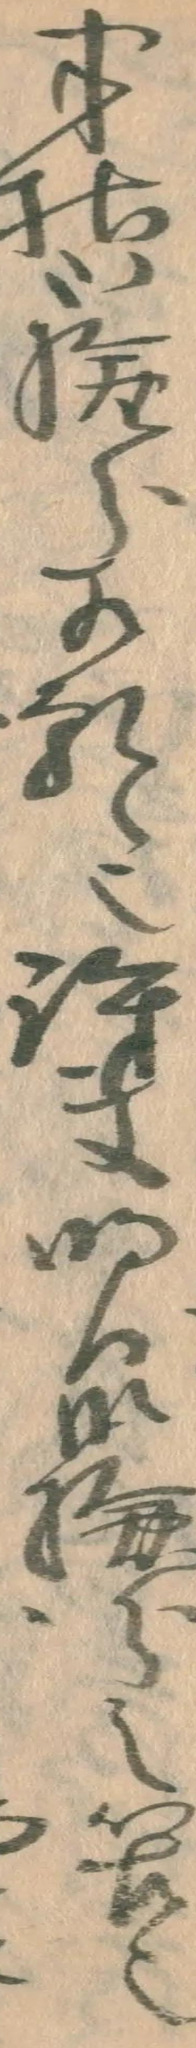半枯御検分相願候也評決明日御検分之筈也
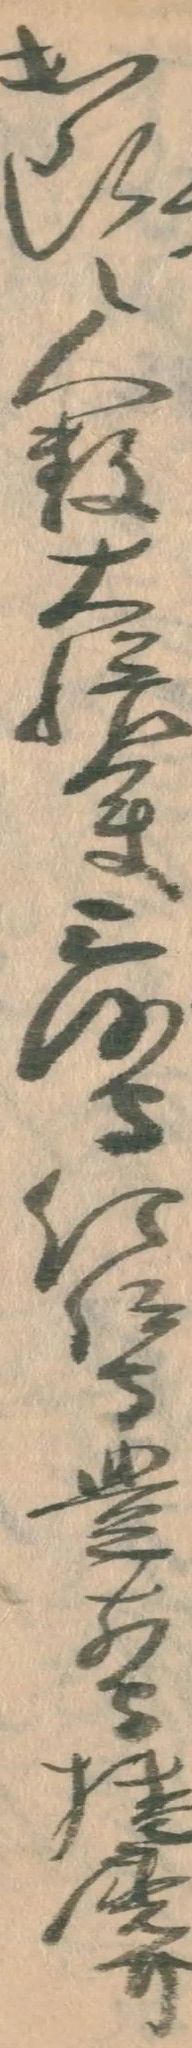出頭之人数大膳大夫三河守紀伊守豊前守播磨介
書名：賀茂社記録. 第60冊
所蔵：国立国会図書館 National Diet Library, JAPAN
